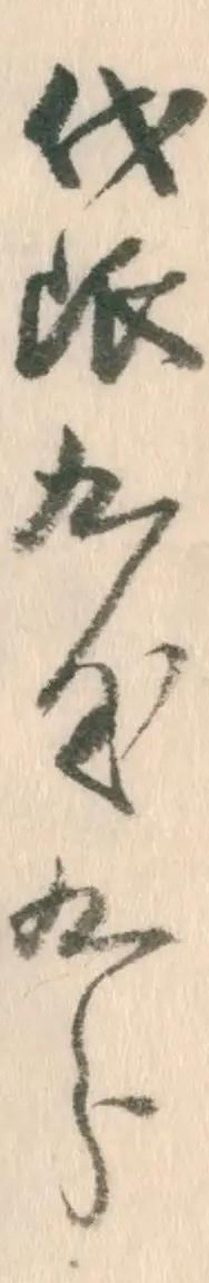代銀九匁九分
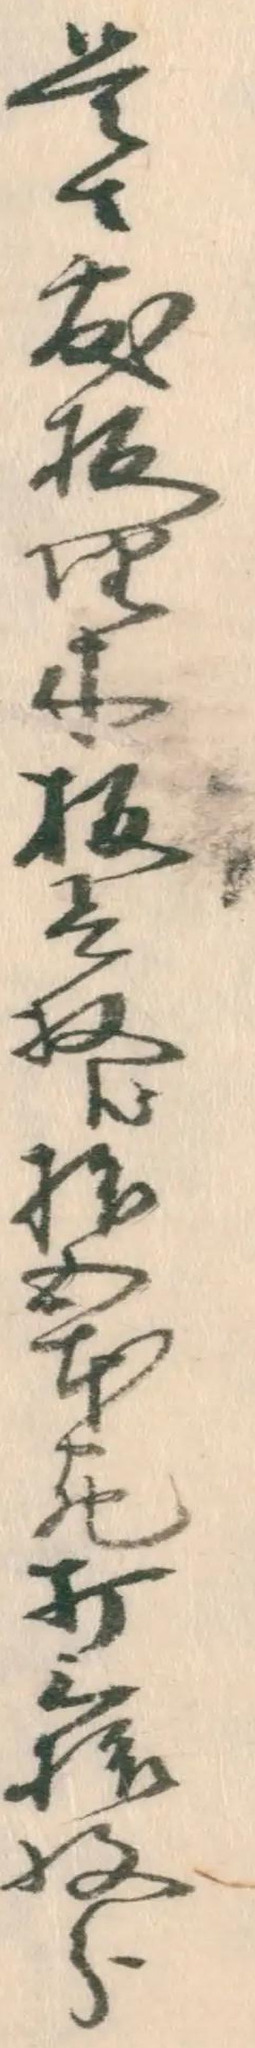是は敷板埋木板壱枚え拾五本宛打三拾枚分
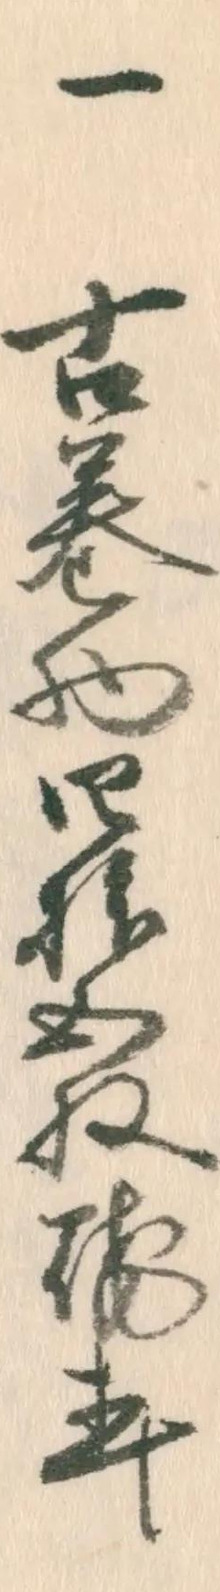一古巻物四拾五枚焼直し
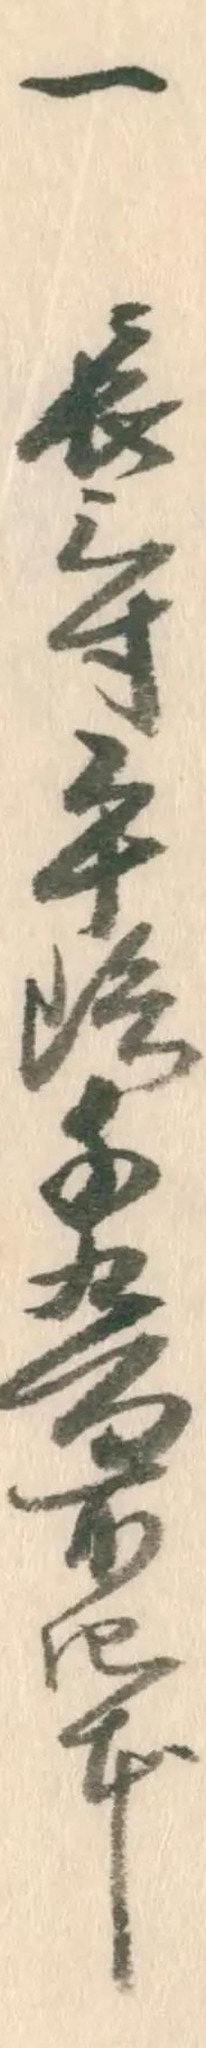一長三寸平鋲千九百廿四本
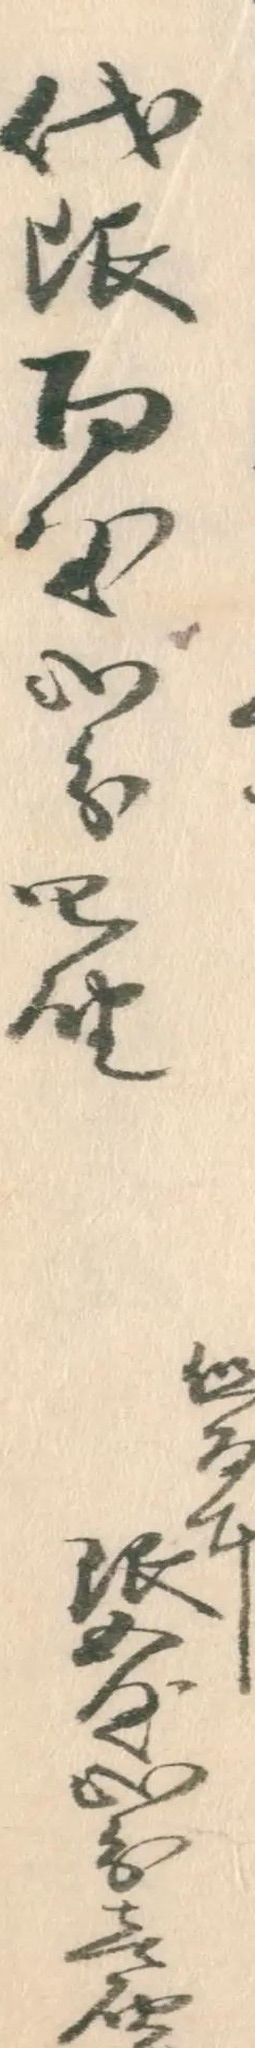代銀百匁弐分四厘但百本銀五匁弐分壱厘
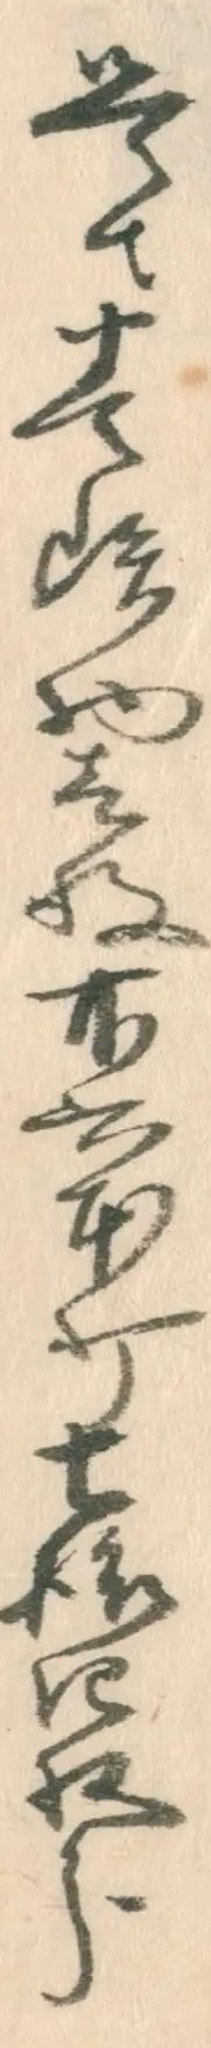是は巻鉄物壱枚廿六本打七拾四枚分

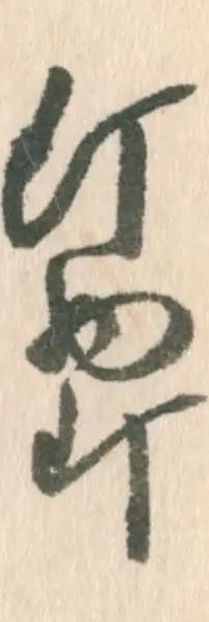釘物釘
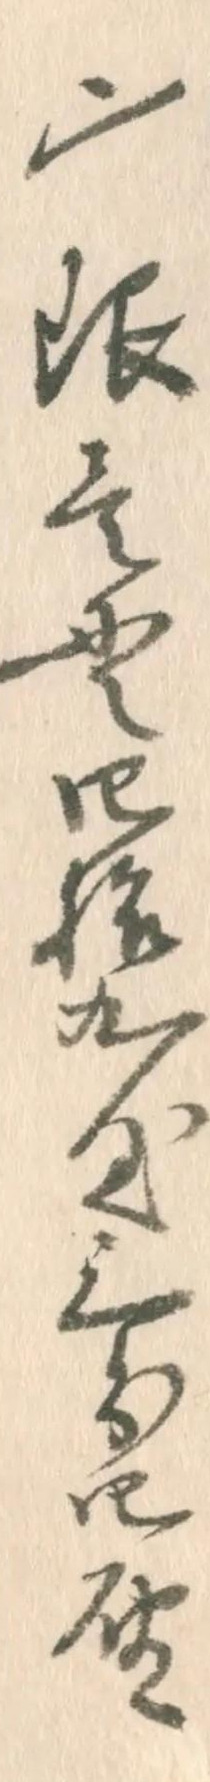〆銀壱貫四拾九匁三分四厘
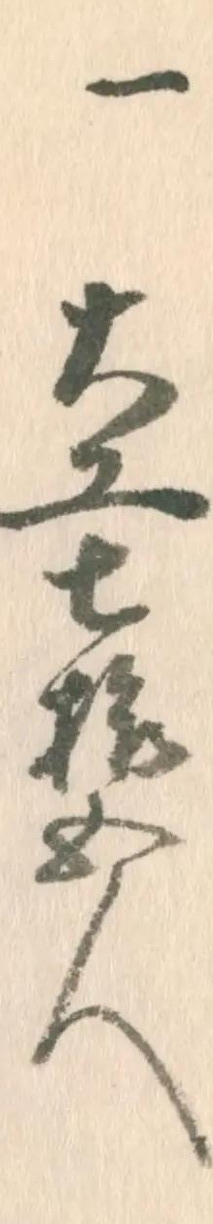一大工七拾五人
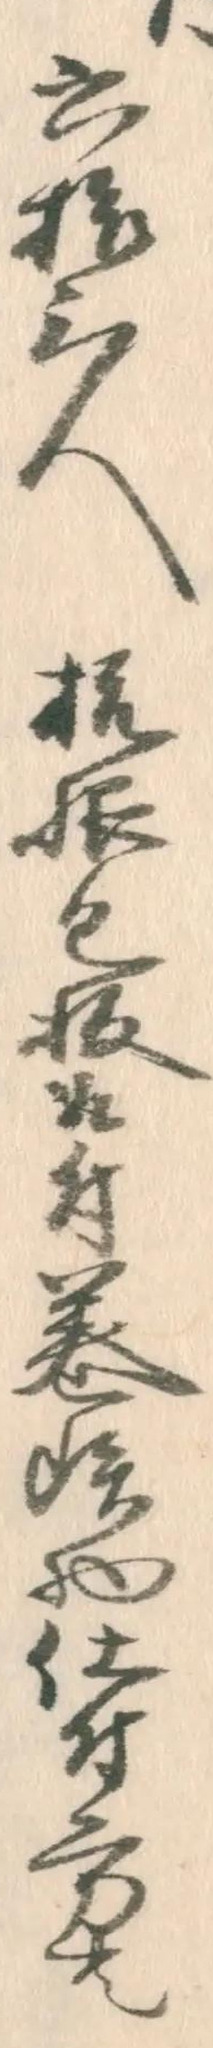六拾三人杭根包板取付巻鉄物仕付方共
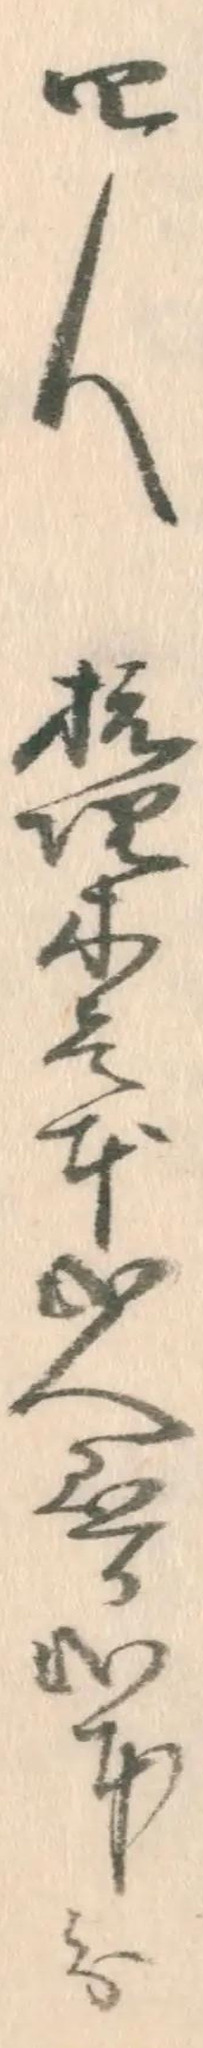四人杭埋木壱本弐人懸り弐本分
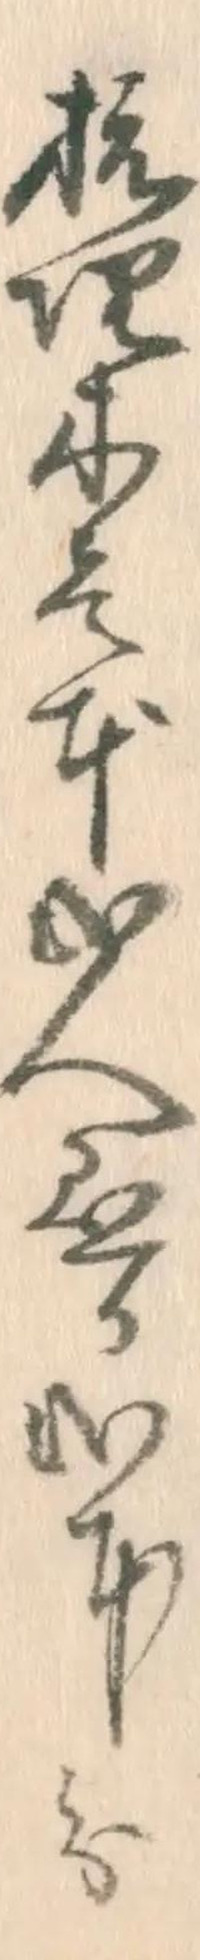四人杭埋木壱本弐人懸り弐本分
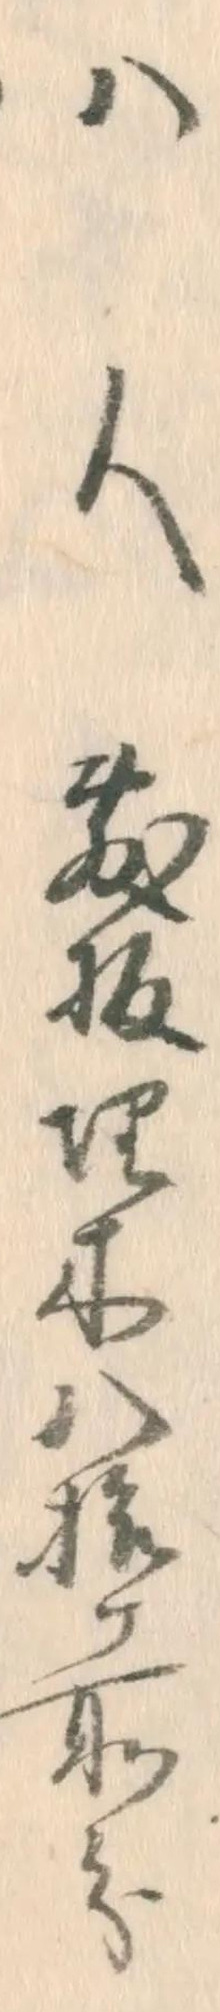八人敷板埋木八拾ケ所分
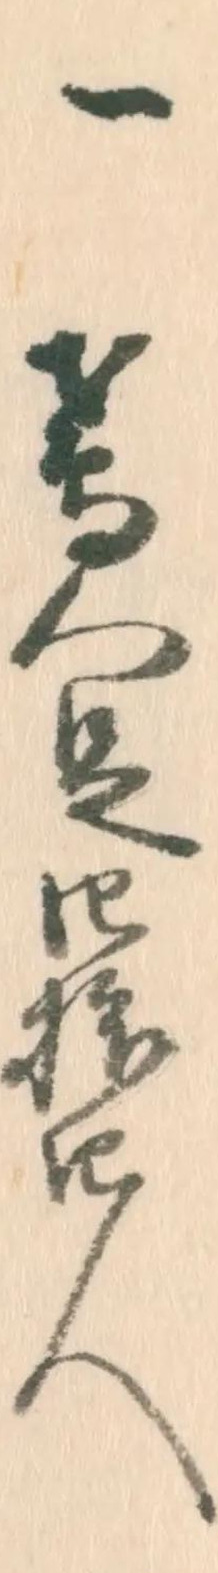一鳶人足四拾四人
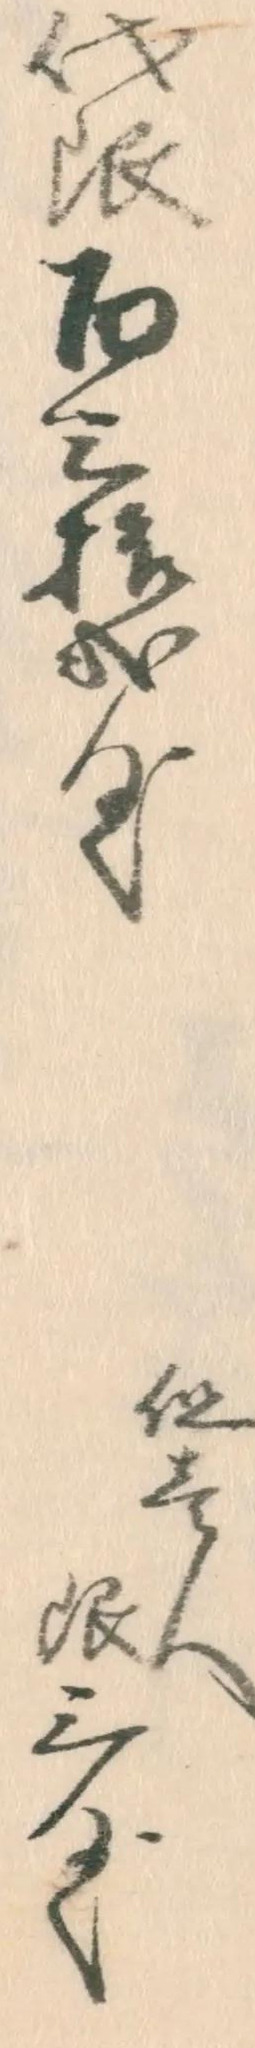代銀百三拾弐匁但壱人銀三匁
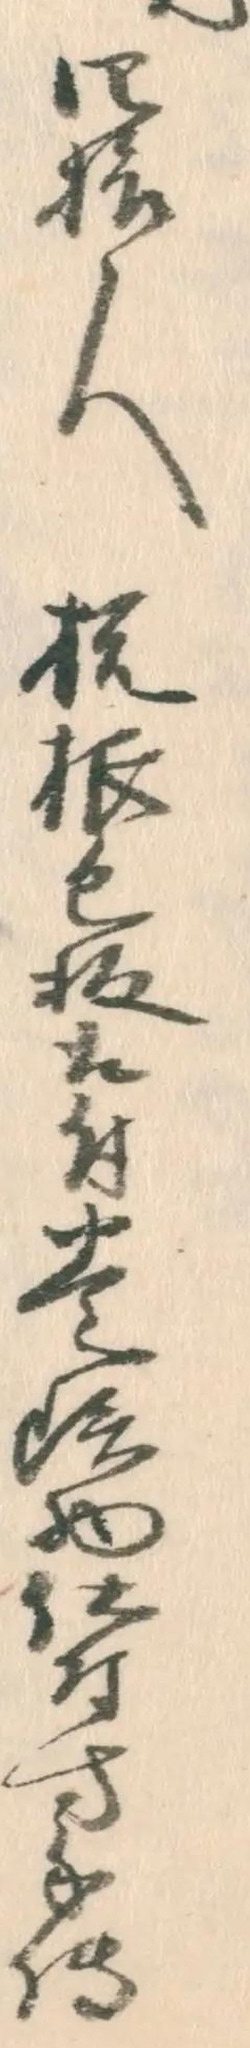四拾人杭根包板取付巻鉄物仕付方手伝
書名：三橋 17巻. [7] 三橋小破御修復書留　但御奉行御掛リ替地震潰橋番屋　嘉永四亥年より安政二卯年迄　上
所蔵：国立国会図書館 National Diet Library, JAPAN
